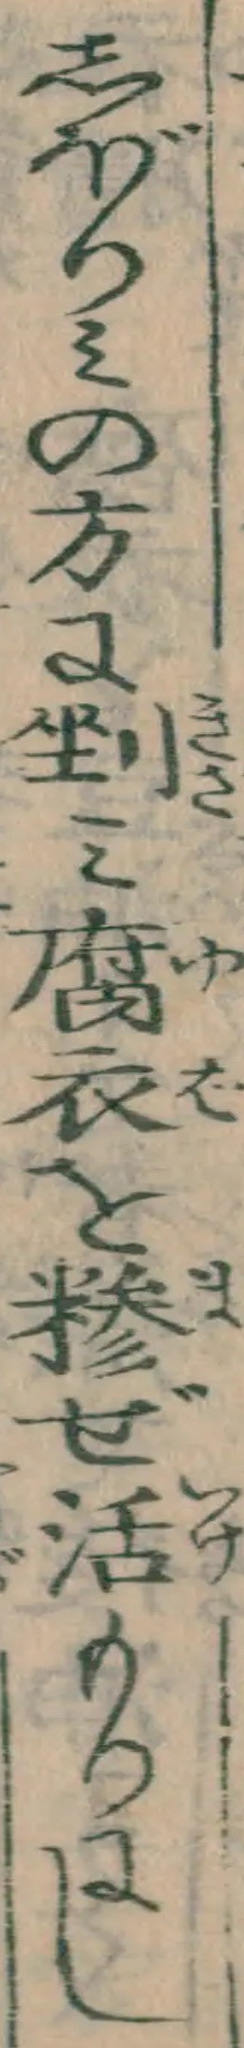しぼりみの方に剉み腐衣を糝ぜ活もりにし
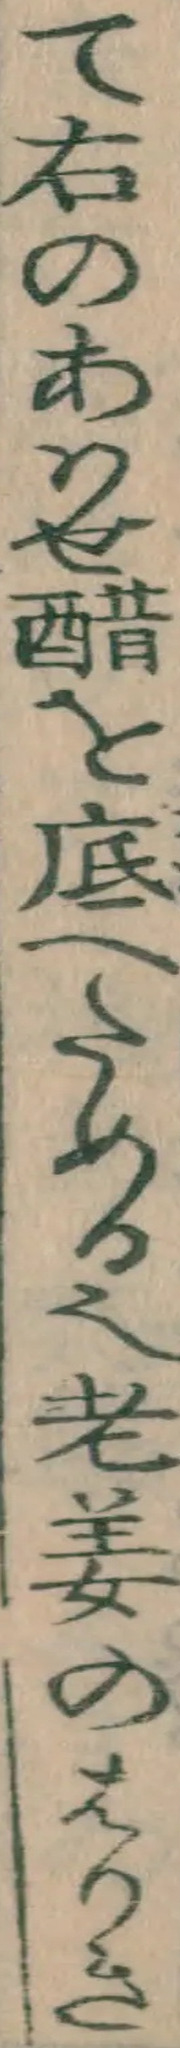て右のあはせ醋を底へためる也老姜のはりき
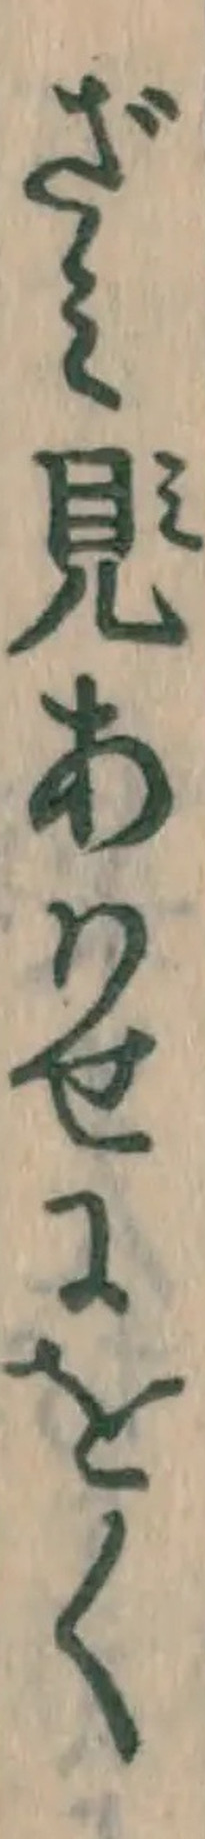ざみ見あはせにをく
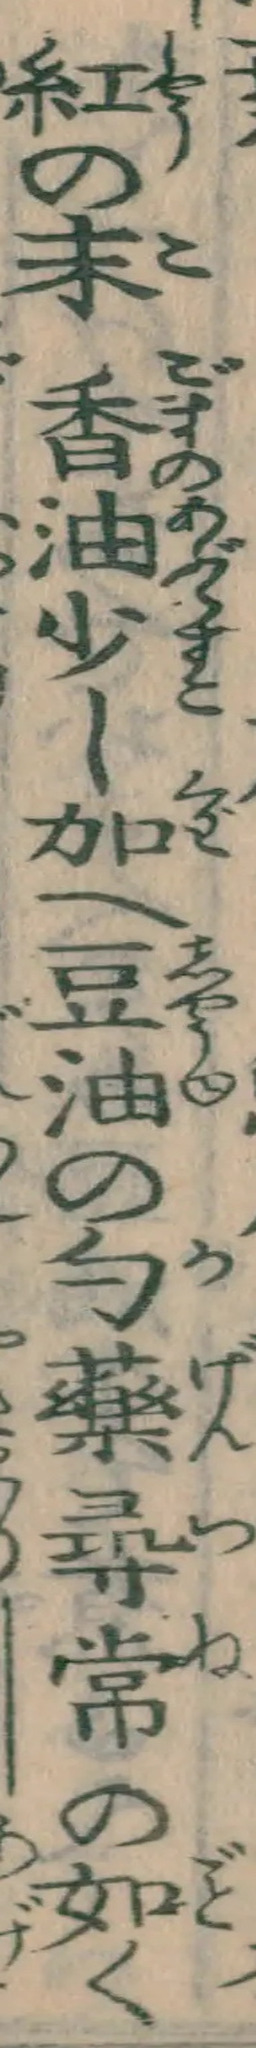紅の末香油少し加へ豆油の勺薬尋常の如く
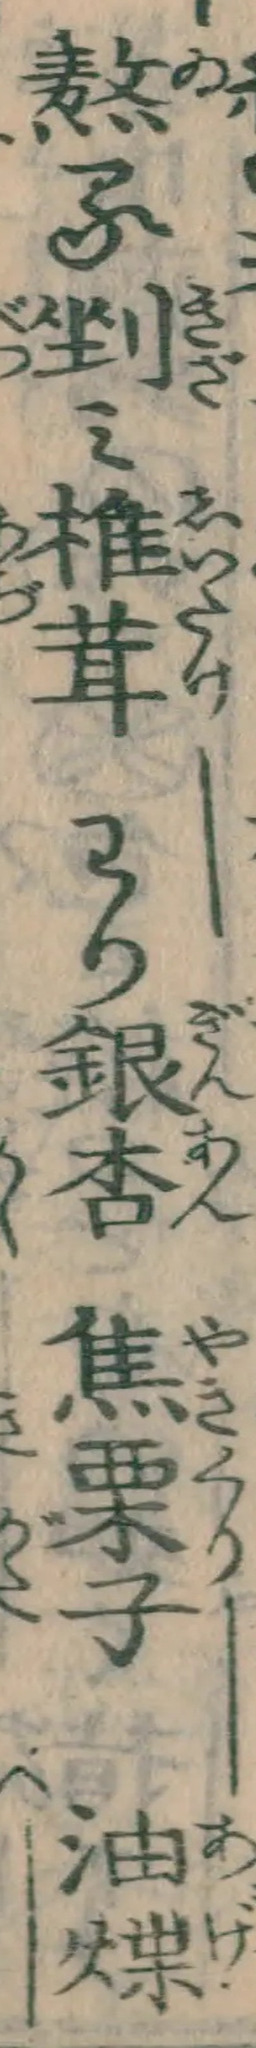熬る剉み椎茸わり銀杏焦栗子油煠
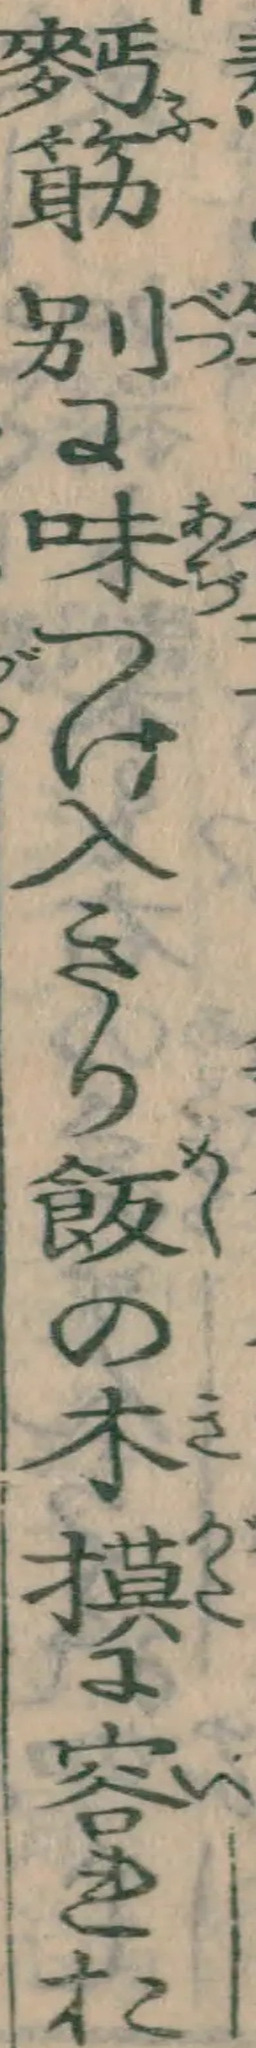麺筋別に味つけ入きり飯の木模に容れお
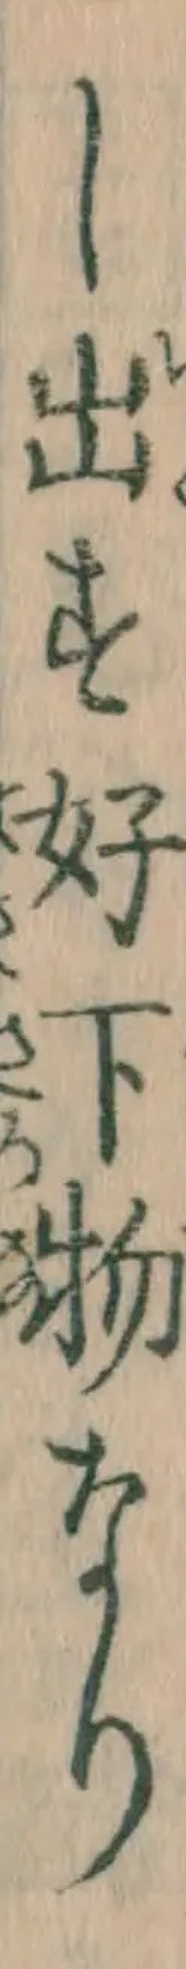し出す好下物なり
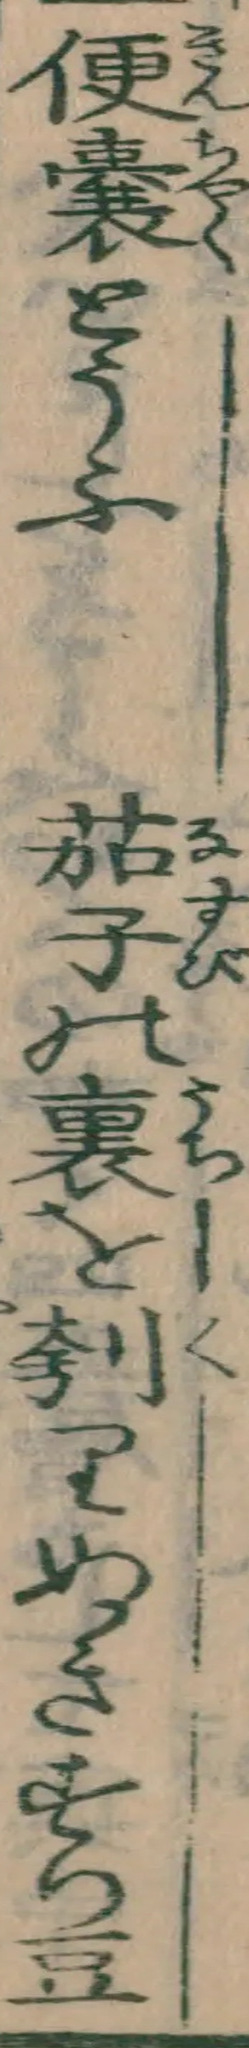十八便嚢とうふ茄子の裏を刳りぬきすり豆
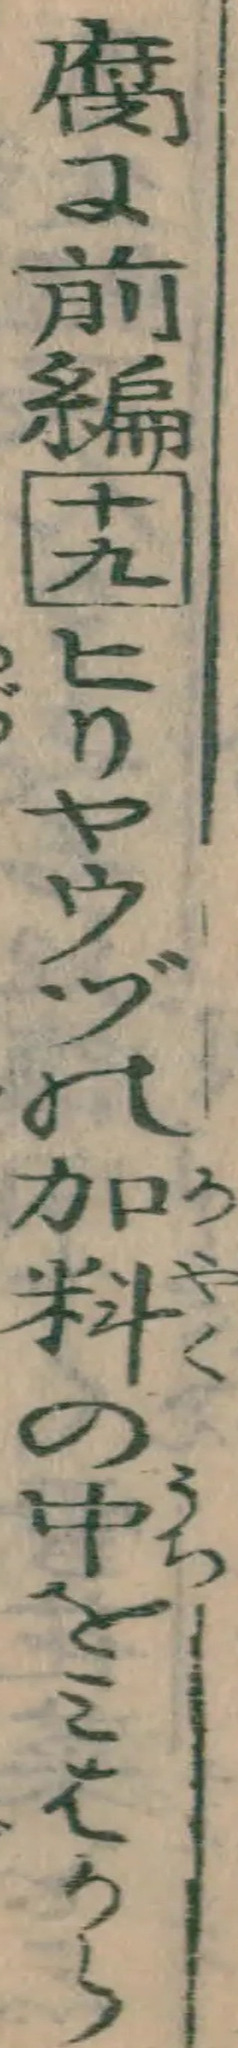腐に前編十九ヒリヤウヅの加料の中をみはから
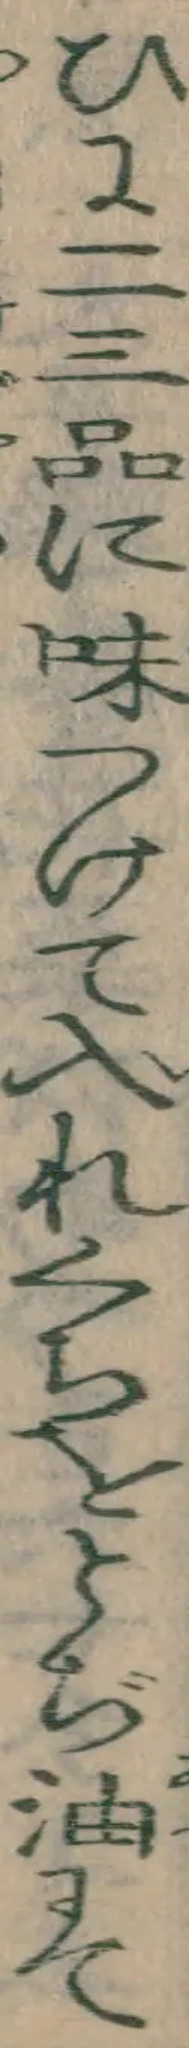ひに二三品に味つけて入れくちをとぢ油にて
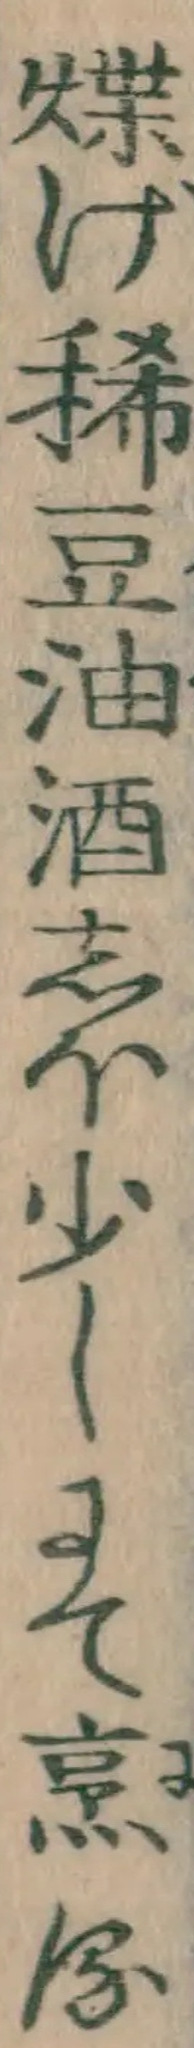煠げ稀豆油酒しほ少しにて烹る
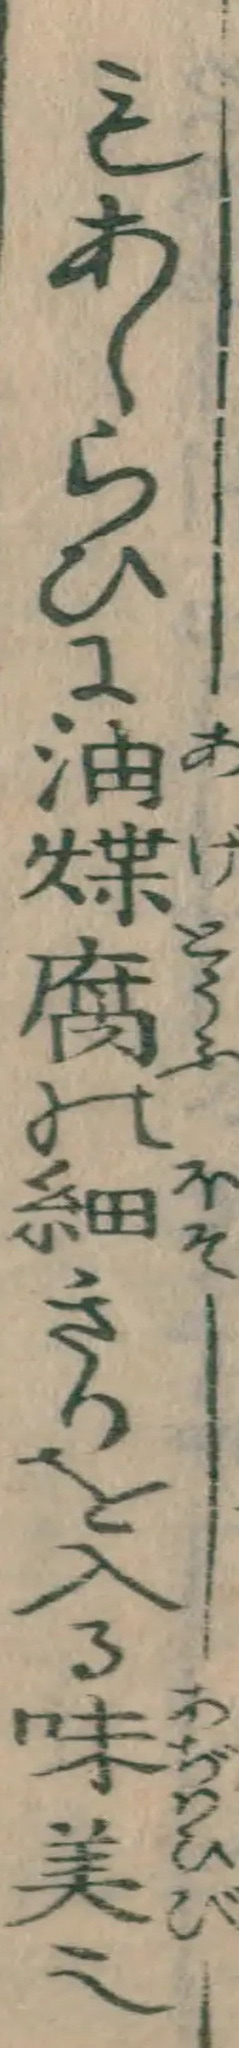もあしらひに油煠腐の細きりを入る味美也

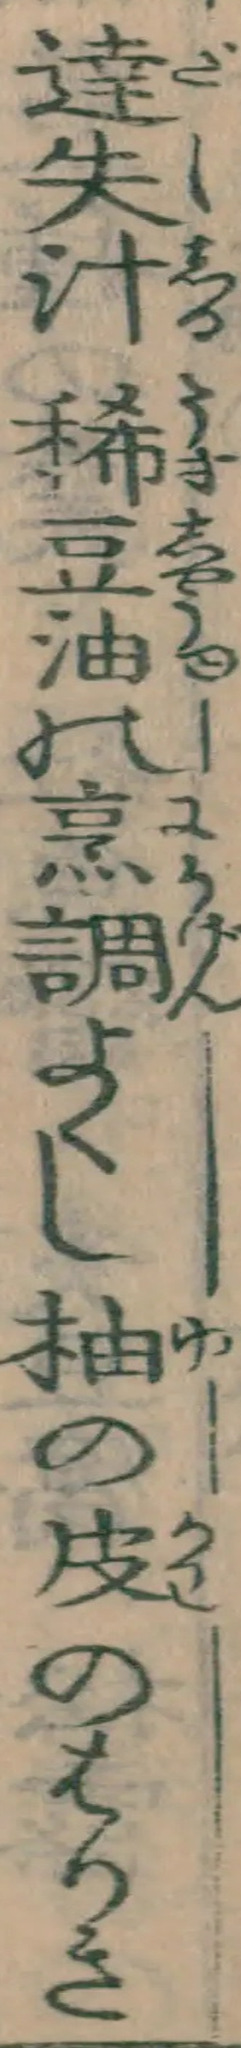達失汁稀豆油の烹調よくし柚の皮のはりき
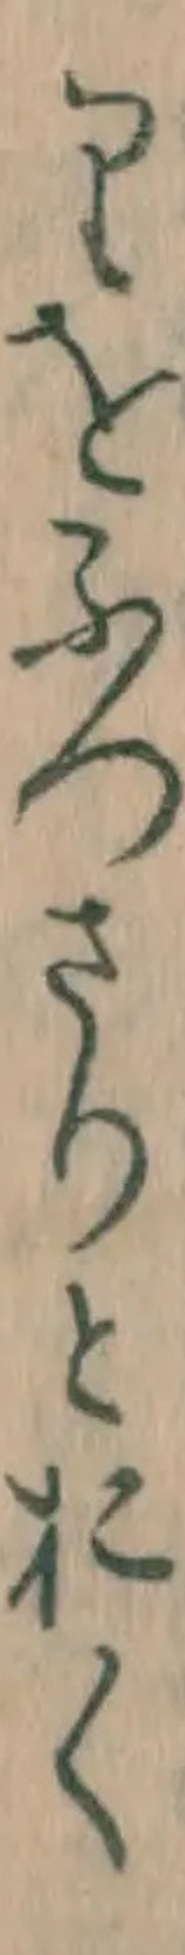りをふつさりとおく
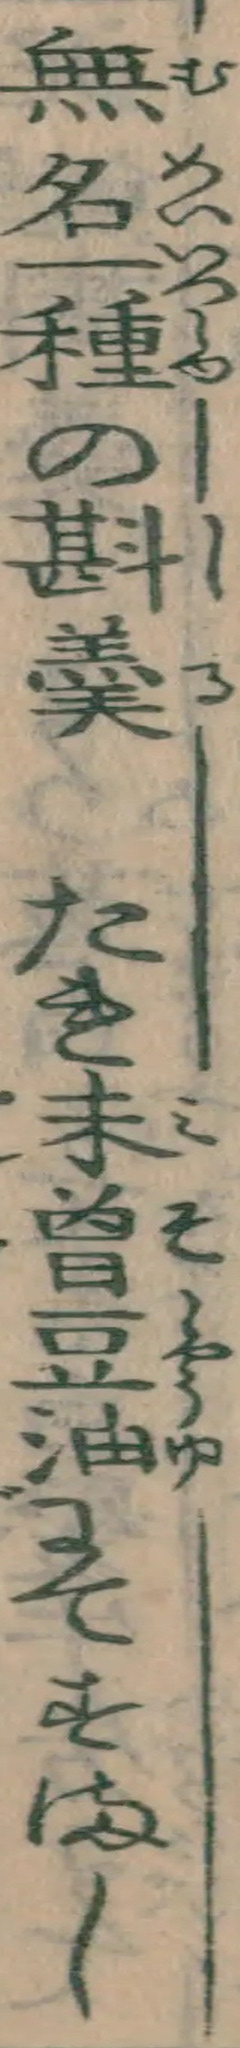廿一無名一種の斟羹たれ未曽豆油にてすまし
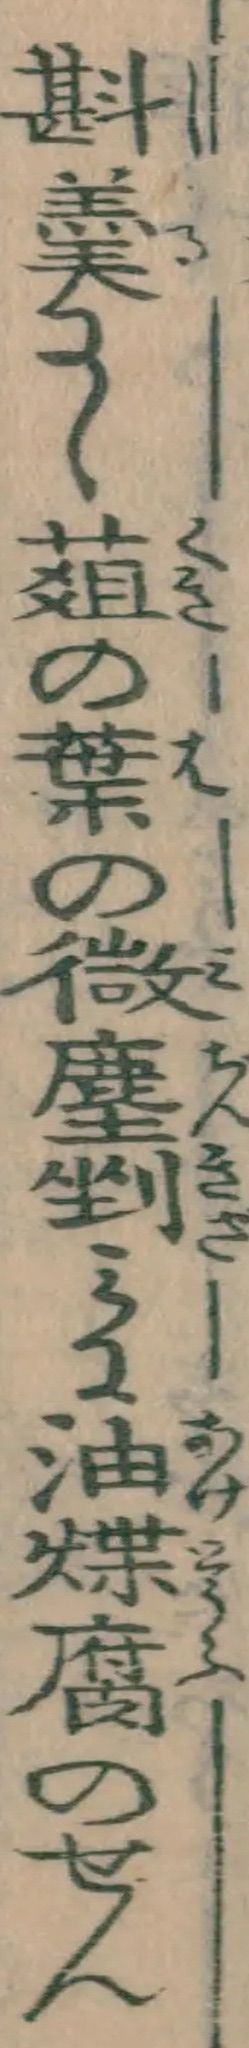斟羹にし葅の葉の微塵剉みに油煠腐のせん
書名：豆腐百珍. 続編
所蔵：国立国会図書館 National Diet Library, JAPAN
